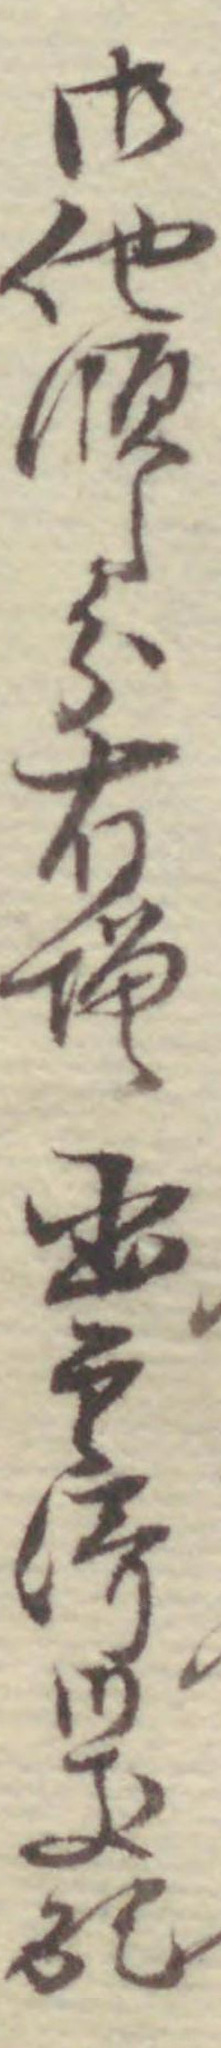御他領之分右増出雲崎御支配
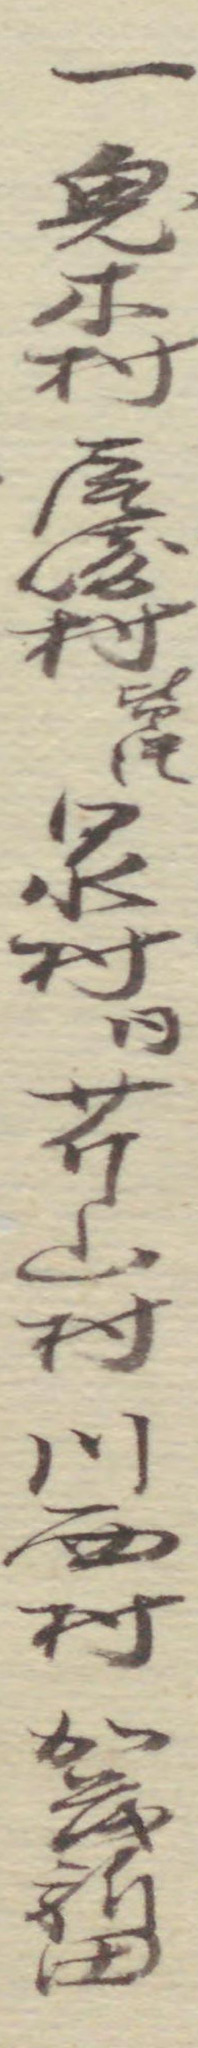一鬼木村尾崎村皆潰泉村同芹山村川西村加茂新田
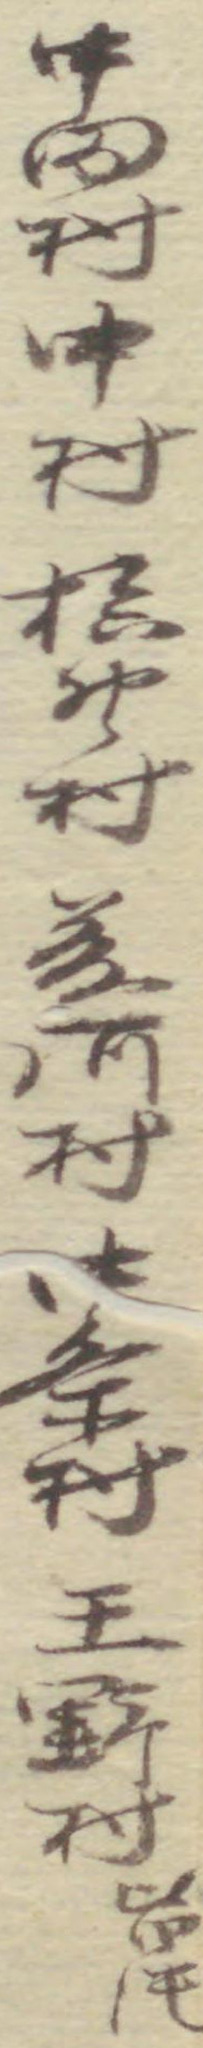中田村中村槙野村藤川村中条村王野村皆潰
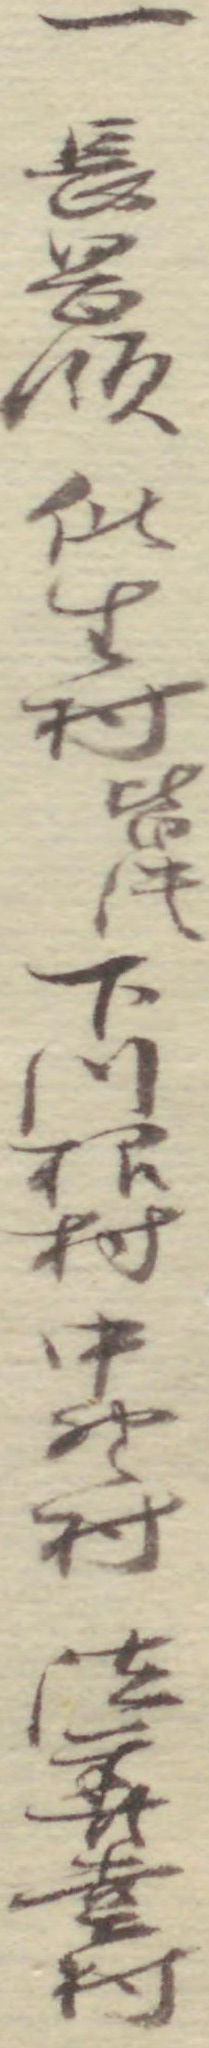一長岡領瓜生村皆潰下川根村中野村法華堂村
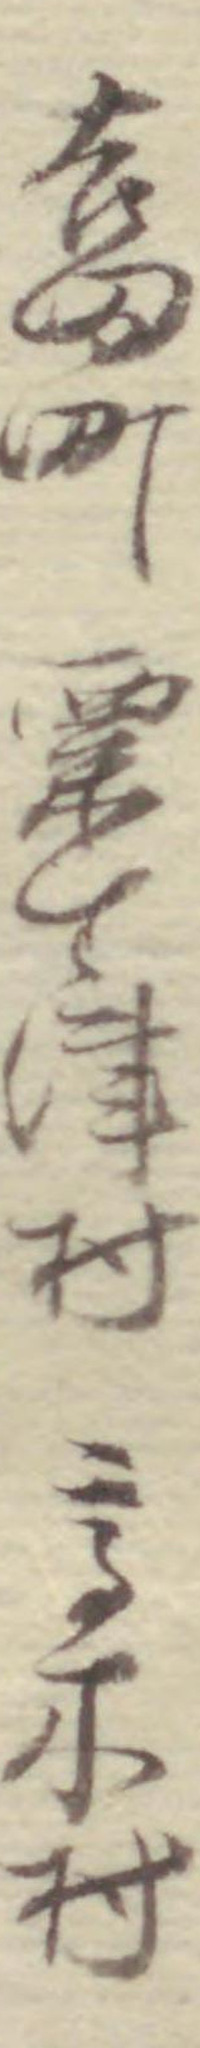吉田町粟生津村高木村
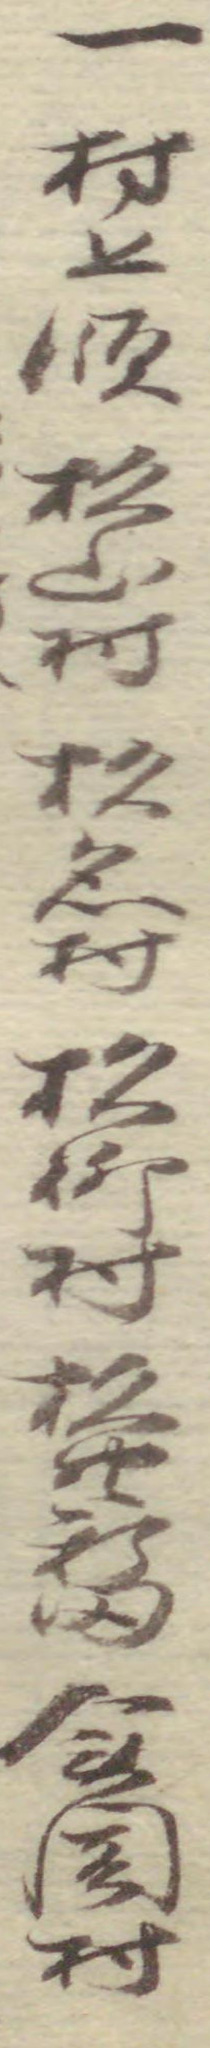一村上領杉山村杉名村杉柳村杉野新田会関村
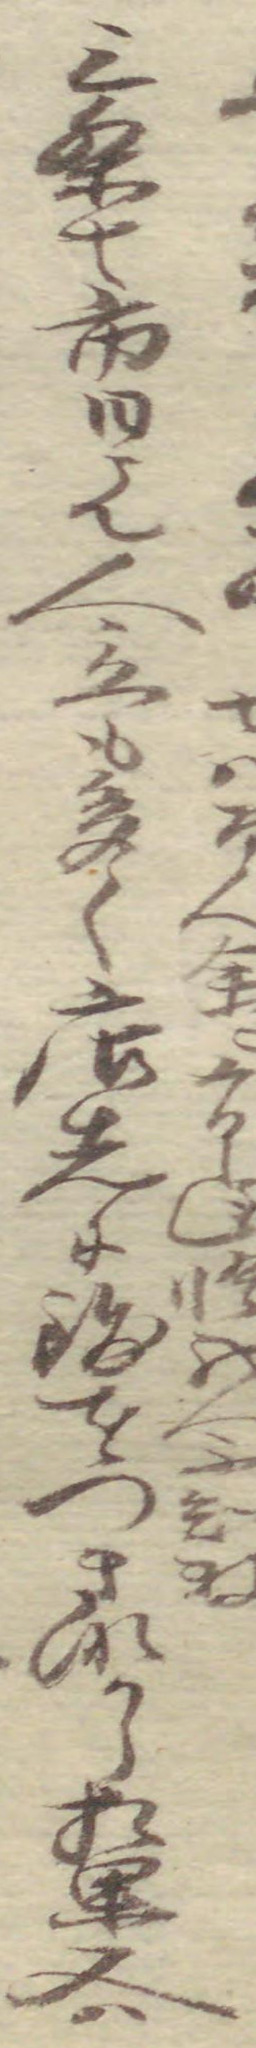三条は市日ニて人立も多く店先に銭をつきなから相果又ハ
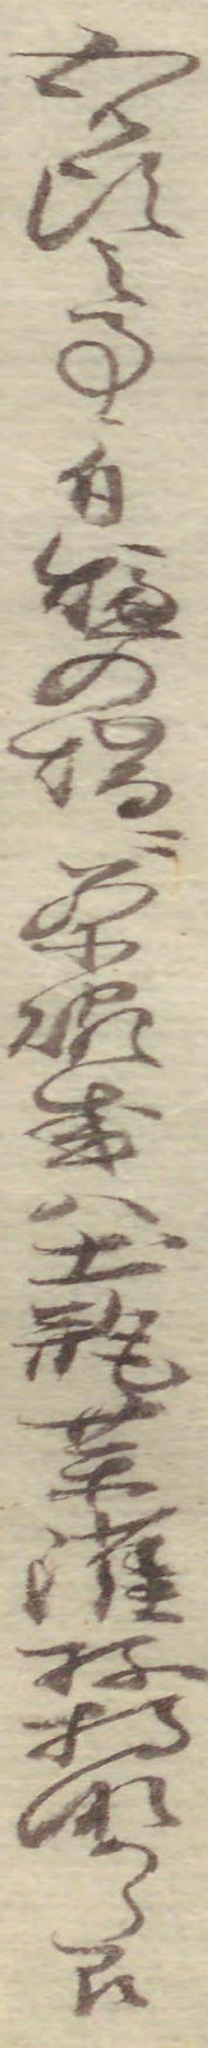五ツ頃之事ニ付爐の端ニ茶碗或ハ土瓶薬灌抔持なから即
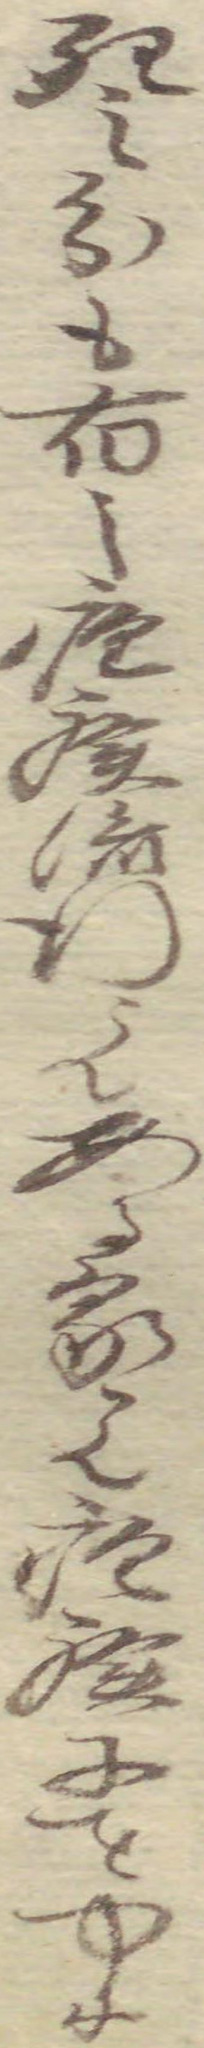死之分も有之痘瘡流行ニてある家ニて痘瘡子を中に
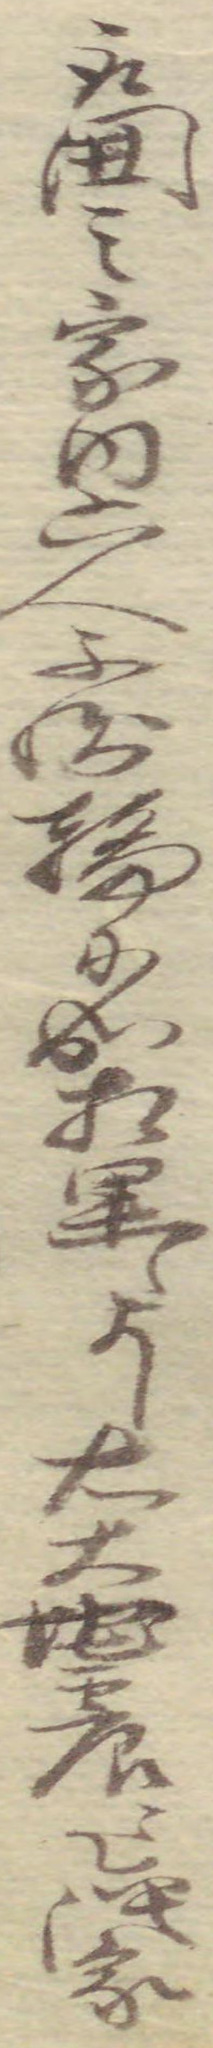取囲ミ家内六人不残輪に成相果候よし右大地震ニて潰家
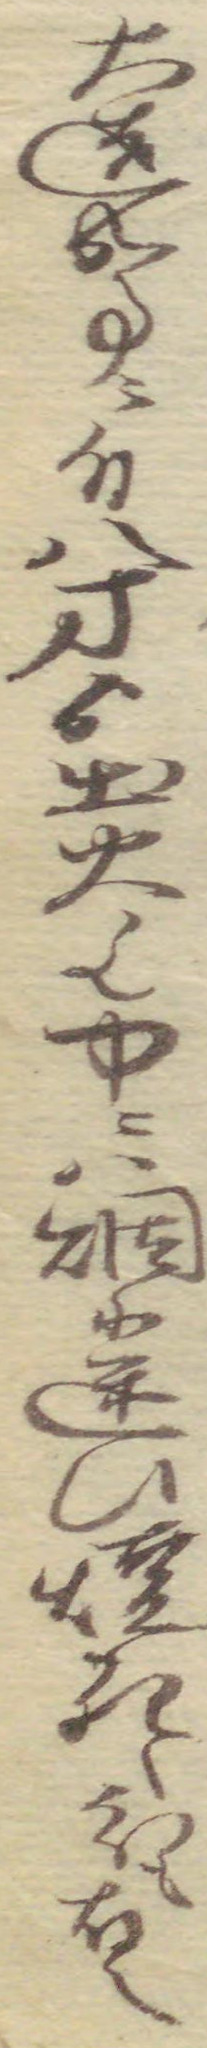大造成事ニ付八方ゟ出火ニて中ニハ烟ニ迷ひ煙死之分も有之

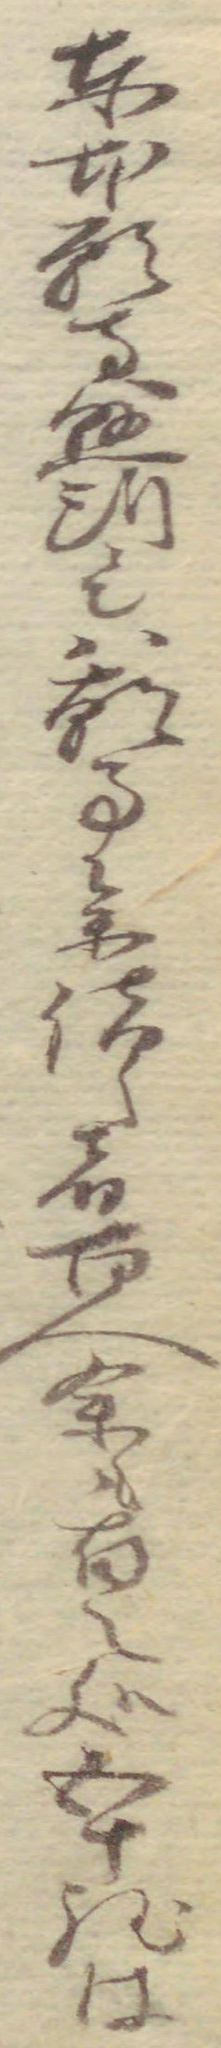東本願寺へ懸所ニてハ願事参詣之者百人余も有候処五十程は
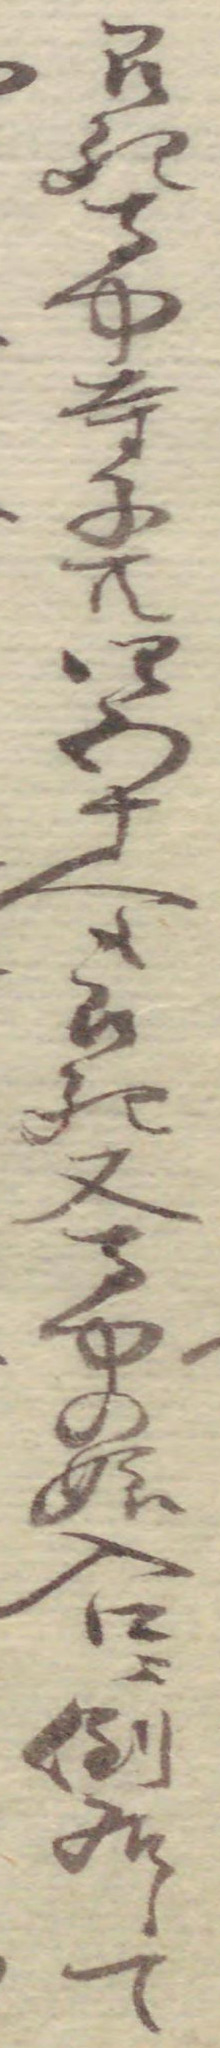即死寺中寺子共四五十人も即死又寺中の娘入口ニ倒居候て
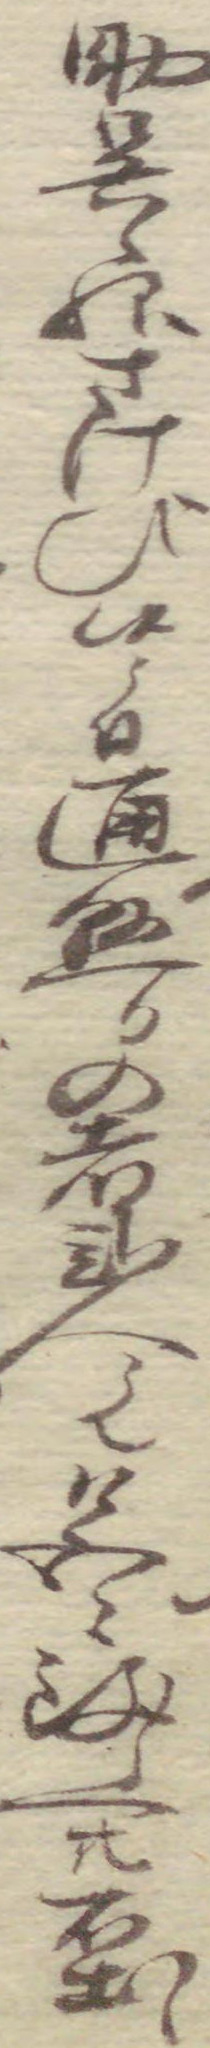助呉候様さけび候ニ付通懸りの者弐人ニて色々致候へ共不出候
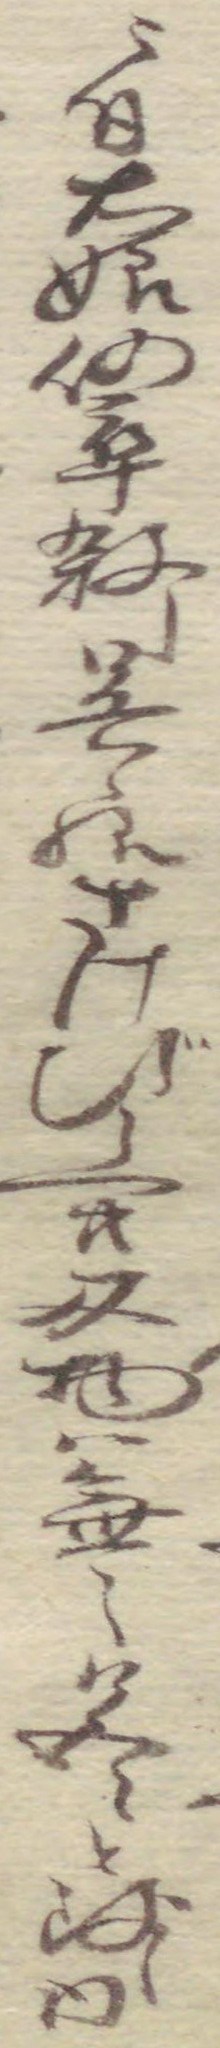ニ付右娘何卒殺し呉候様さけび候へ共刃物ハ無之色々と致候内
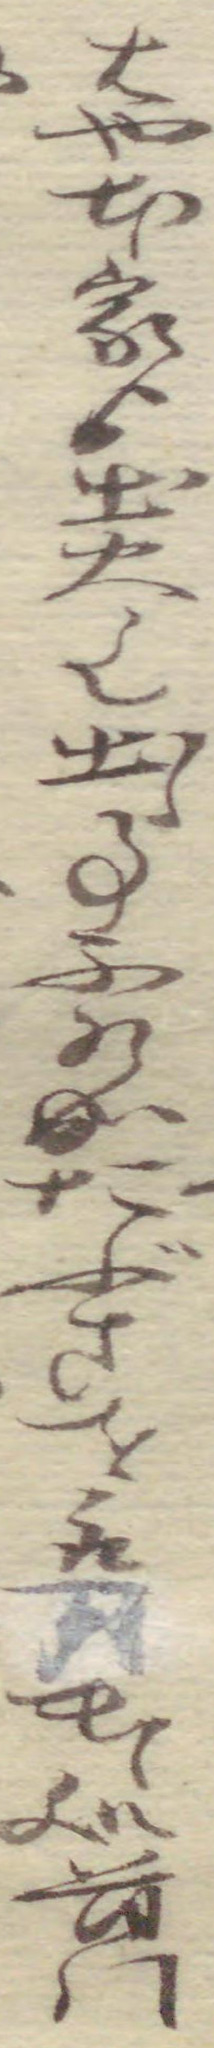はや本家ゟ出火ニて出候事不相成たぶさを取出候処首引
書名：鶯宿雑記. 巻199-200
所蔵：国立国会図書館 National Diet Library, JAPAN
